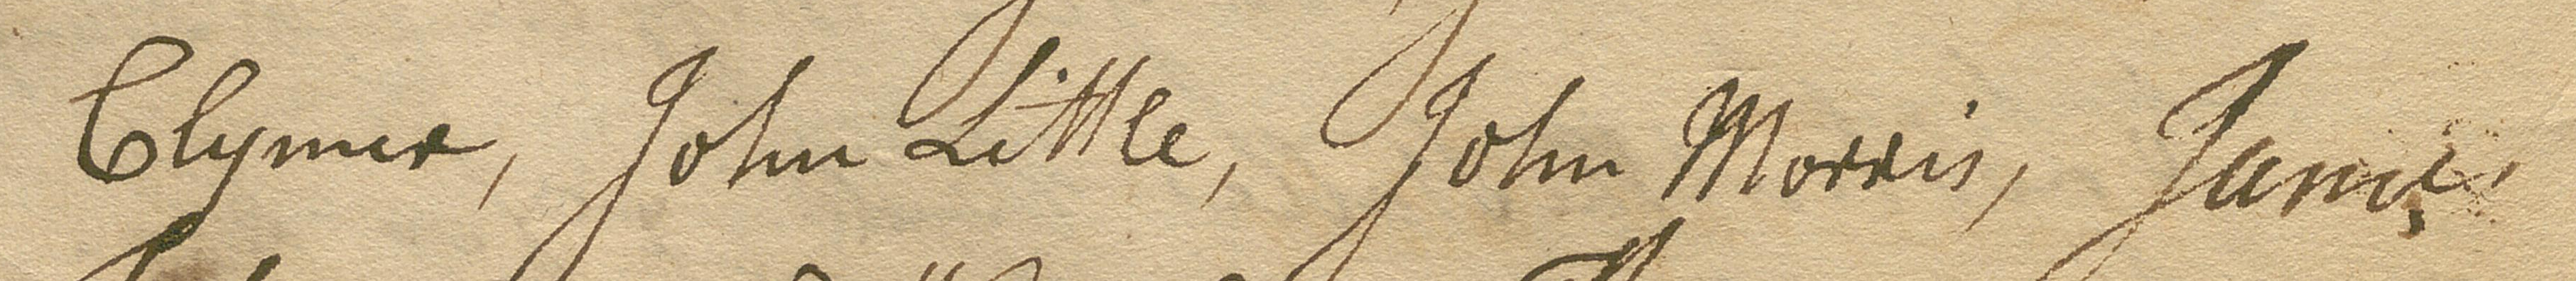Clymer, John Little, John Morris, James
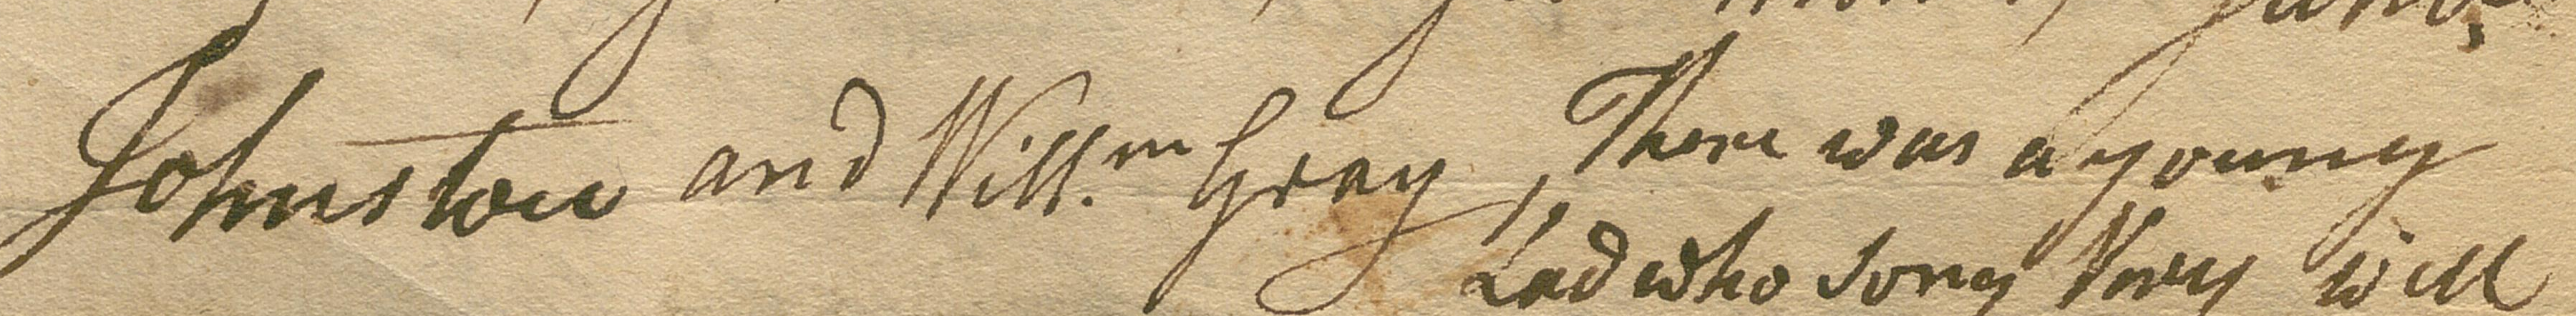Johustow and Will^m. Gray, There was a young
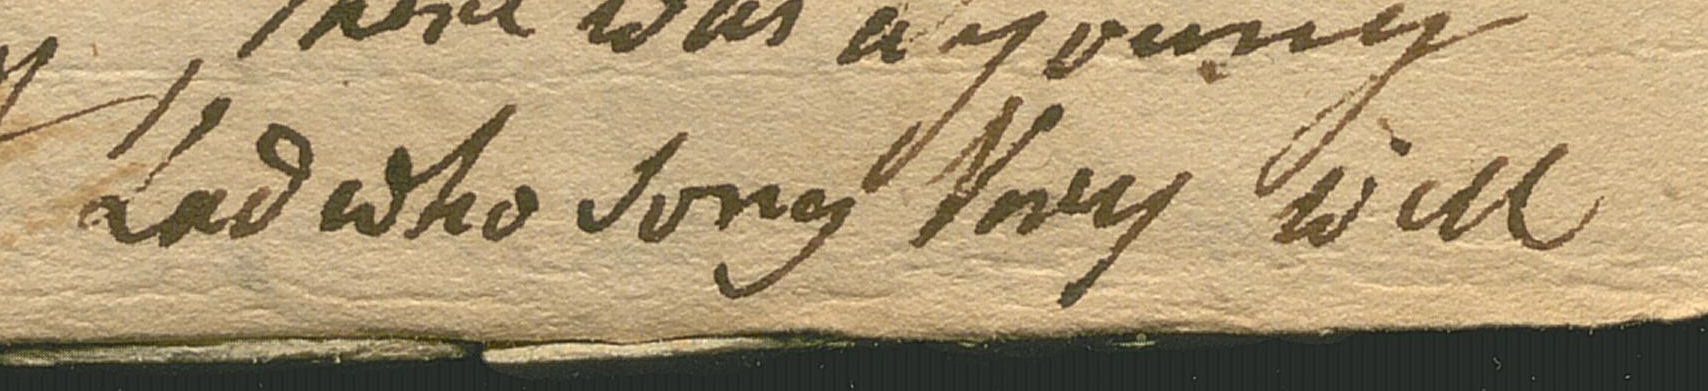Lad who Song Very well
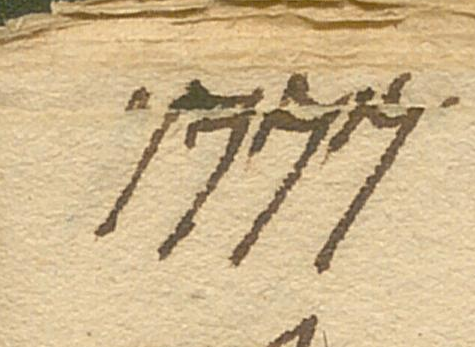1777
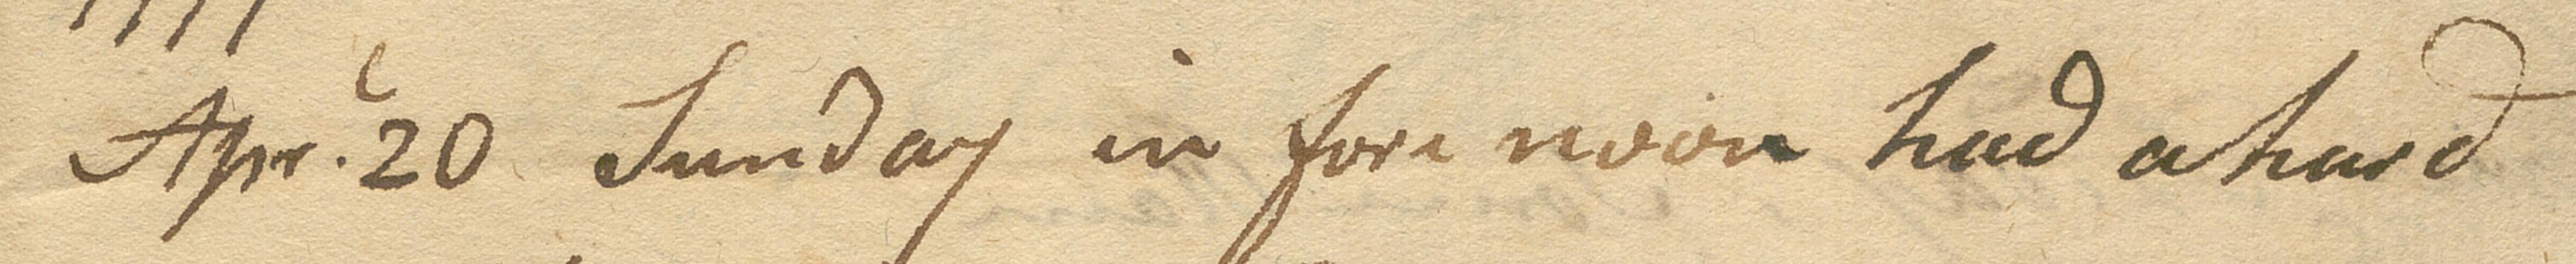Apr^l. 20 Sunday in fore noon had a hard
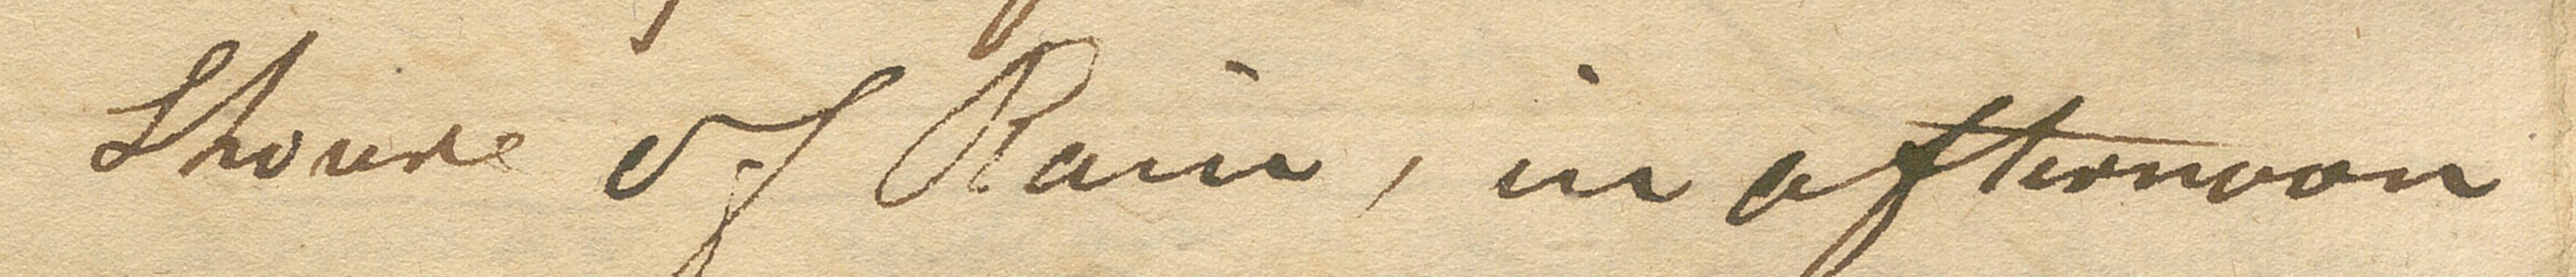Shoure of Rain, in afternoon
